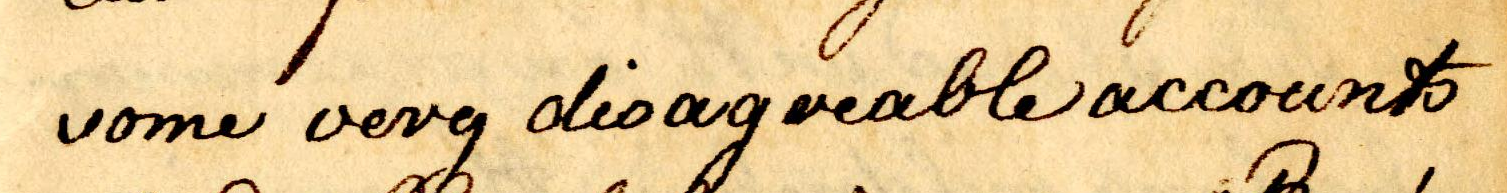some very disagreable accounts
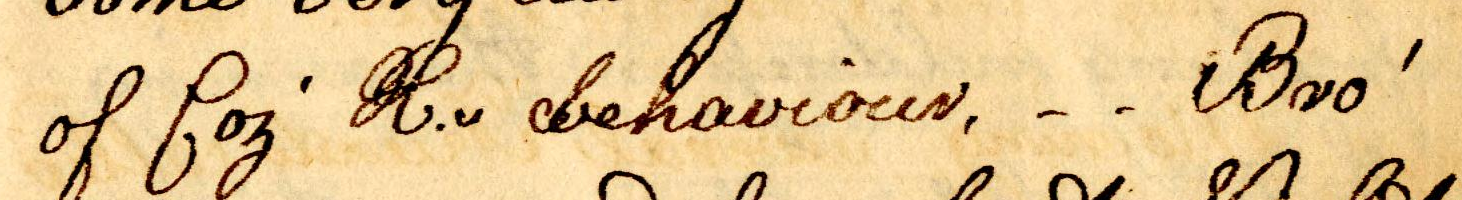of Coz' H.s behaviour,-- Bro'
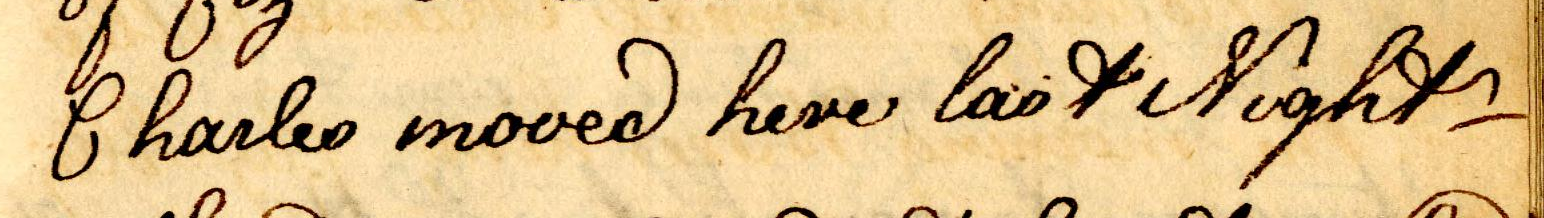Charles moved here last Night-
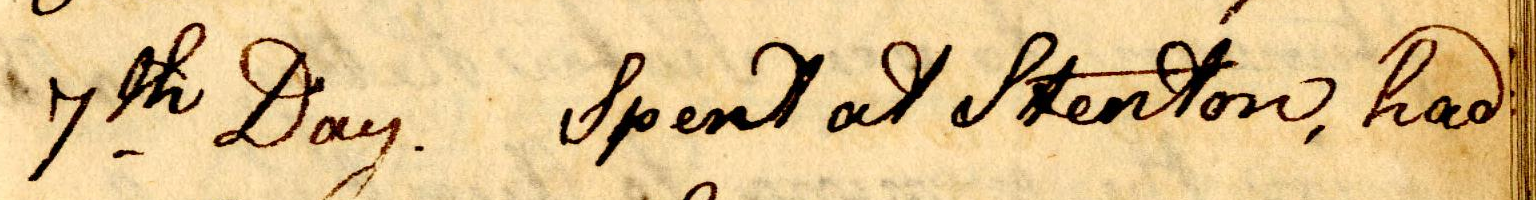7^th Day. Spent at Stenton, had
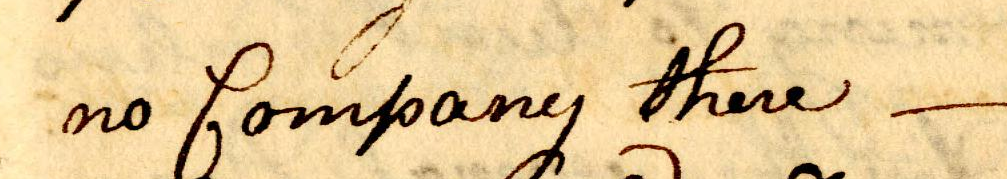no Company there-
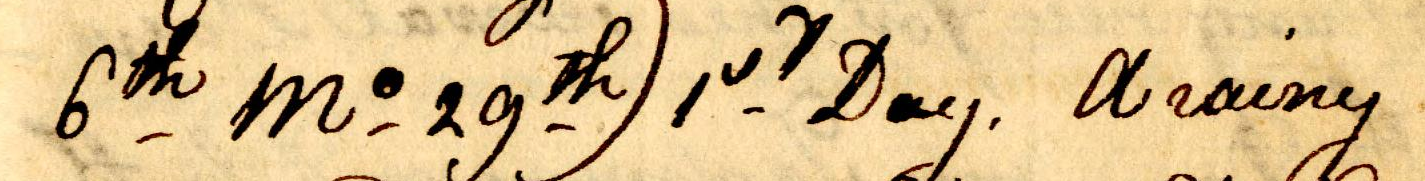6^th M^o 29^th ) 1^st Day. A rainy
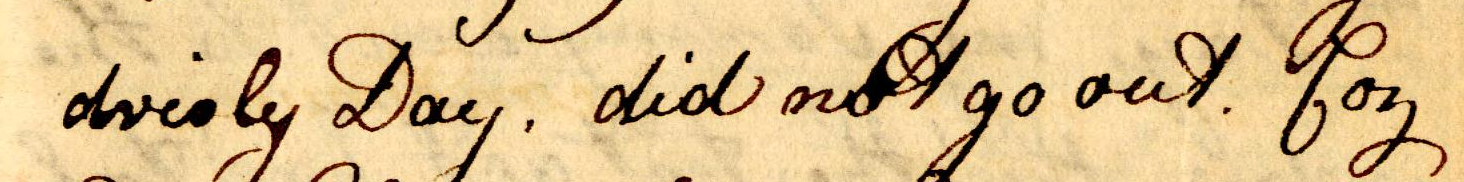drisly Day. did not go out. Coz
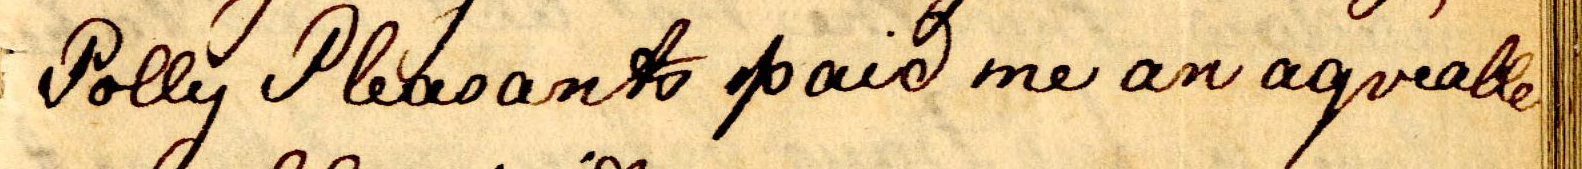Polly Pleasants paid me an agreable
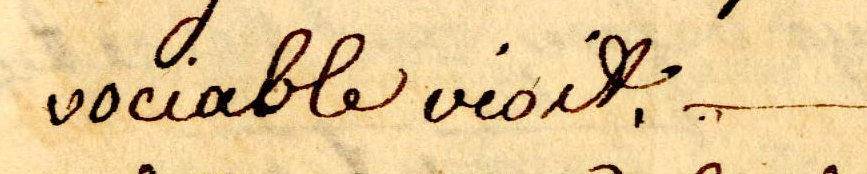sociable visit.-
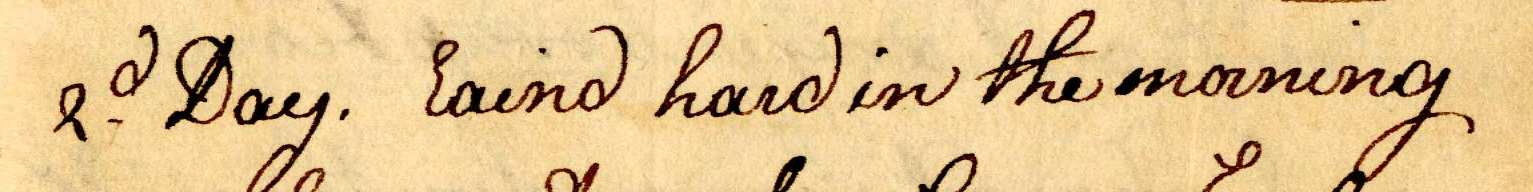2^d. Day. raind hard in the morning
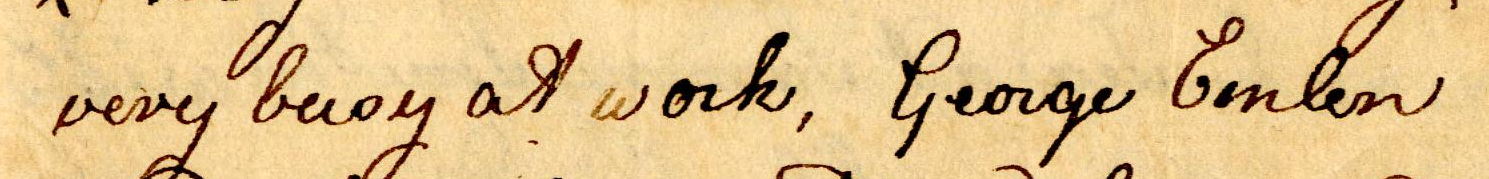very busy at work, George Emlen
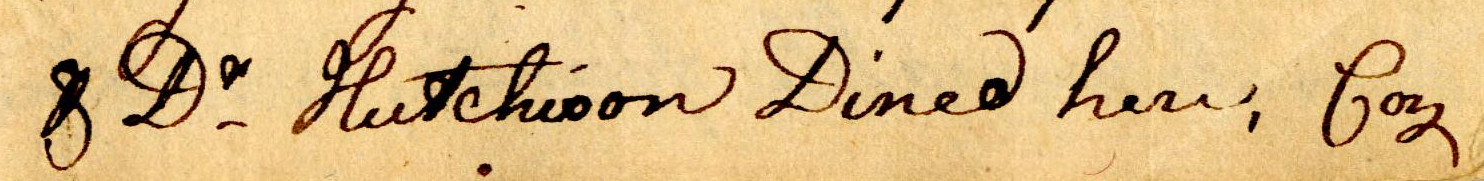& D^r Hutchinson Dined here, Coz
